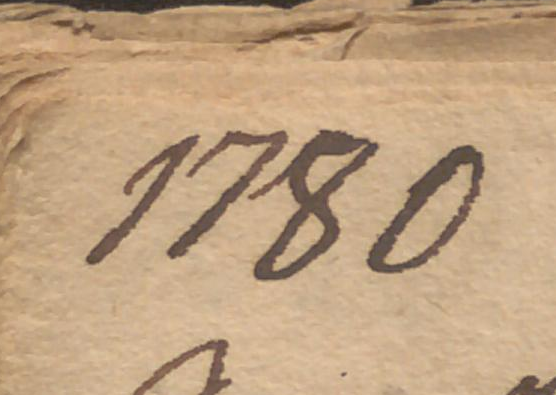1780
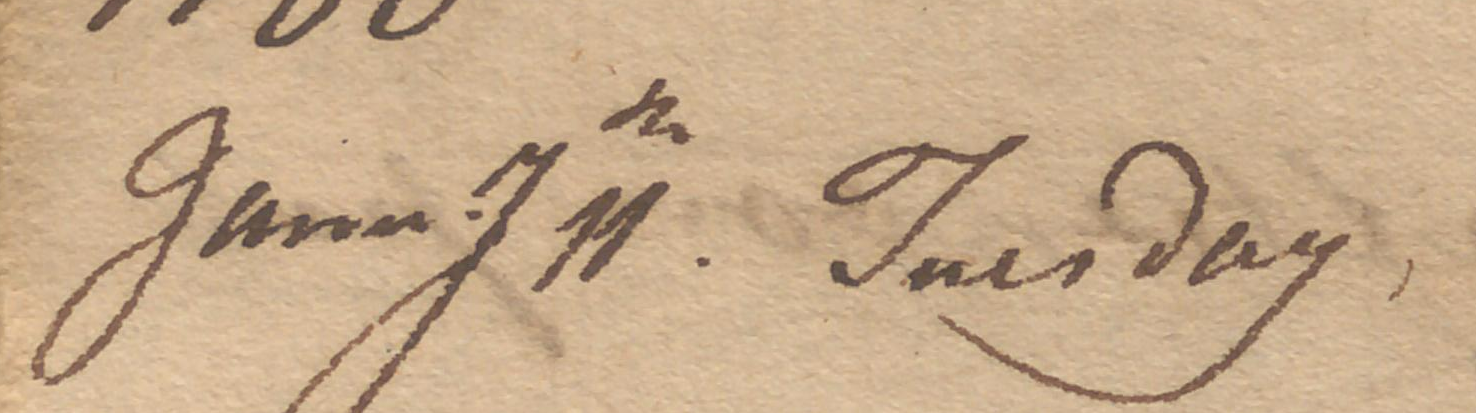Jan^y. 11^th. Tuesday
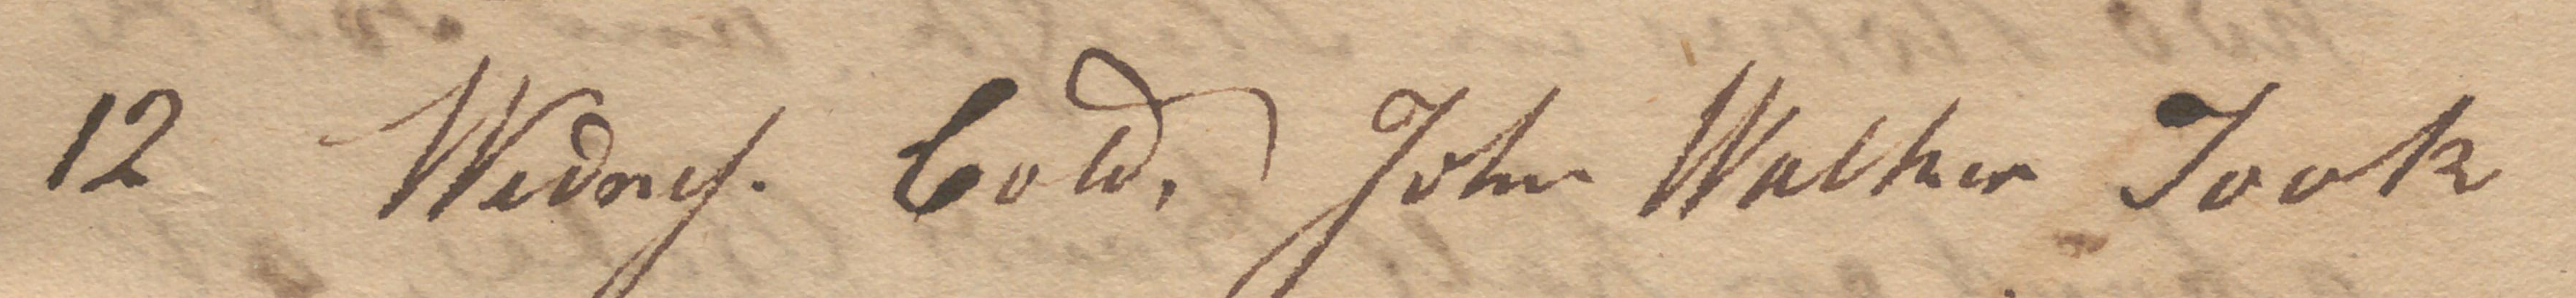12 Wednes. Cold, John Walker Took
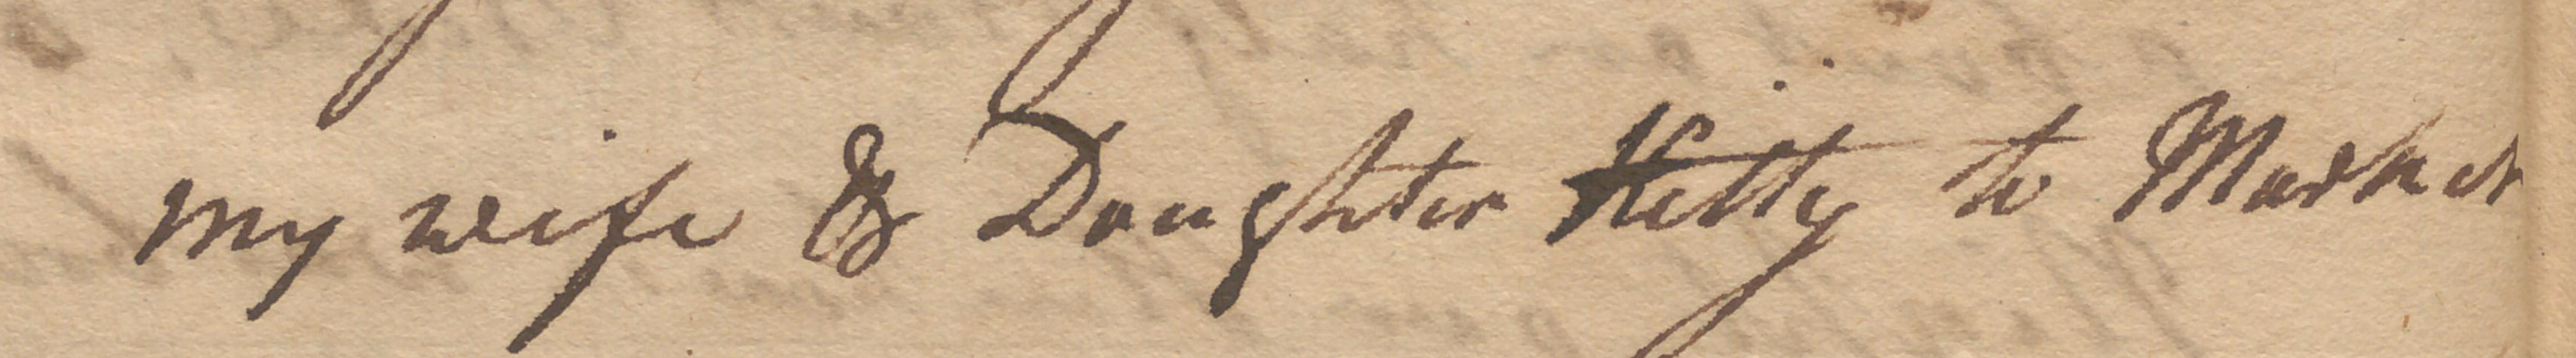my wife & Daughter Kitty to Market
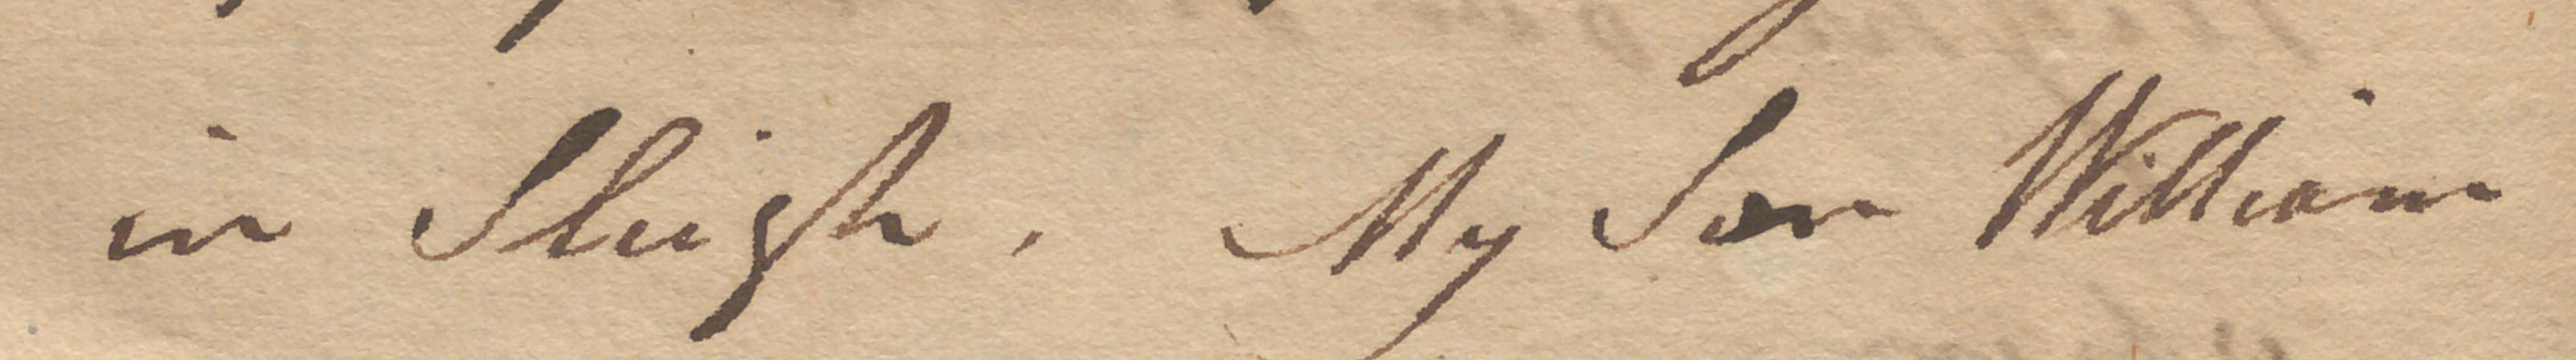in Sleigh, My Son William
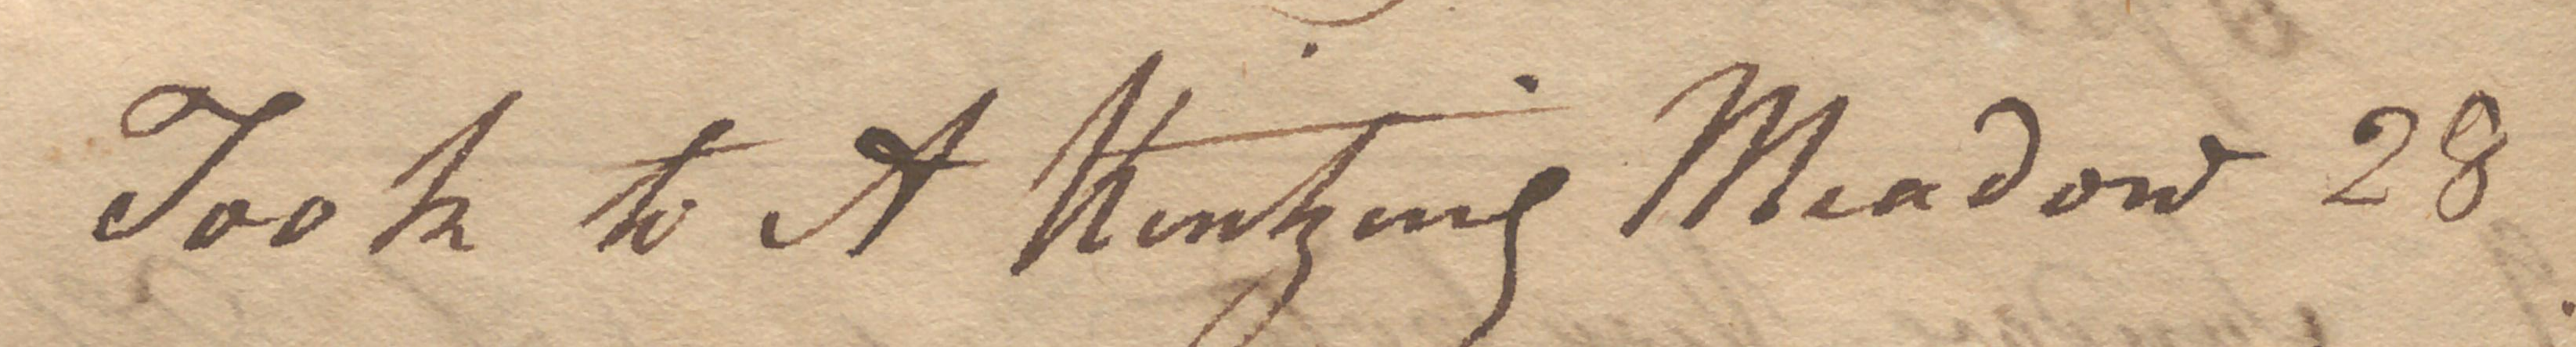Took to A Kintzing Meadow 28
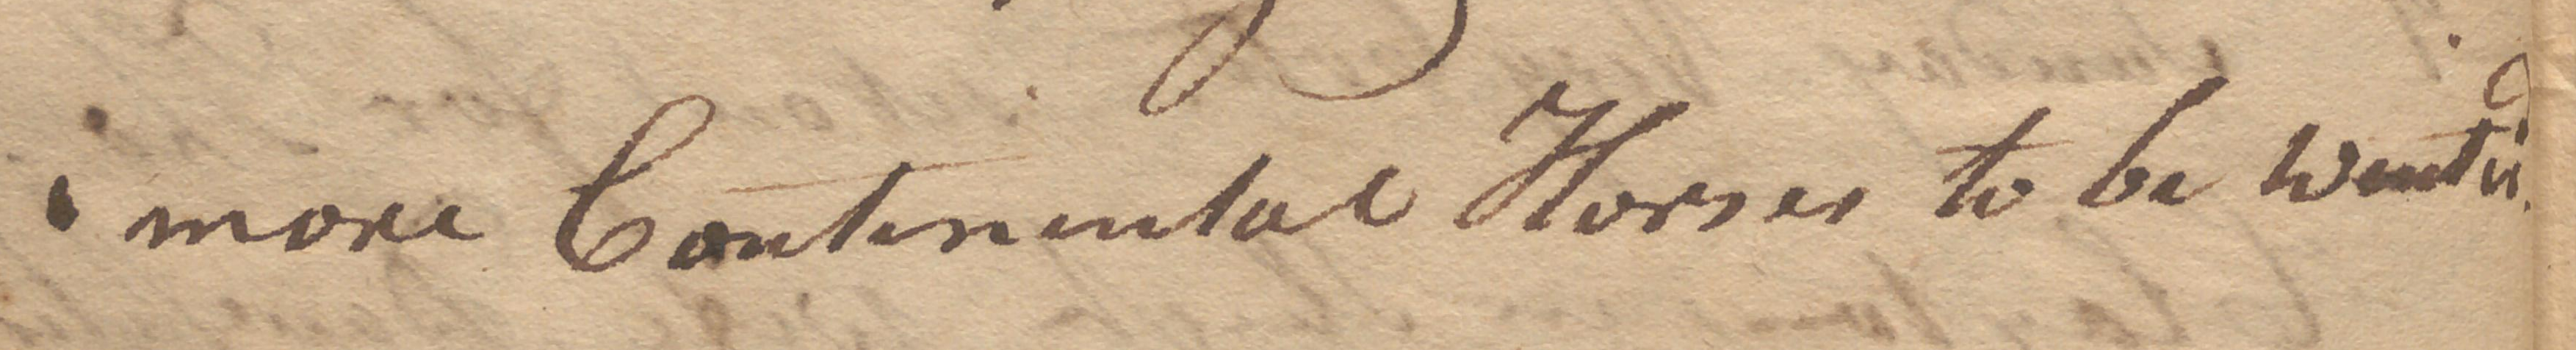more Continental Horses to be winterd
